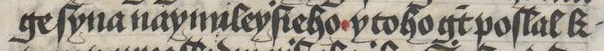ge ſyna naymileyẛíeho.y toho ḡt poſlal k
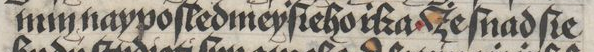nim naypoſlednieyẛíeho ṙka.Że ſnad ſie
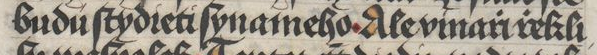budu ſtydieti ſyna meho.Ale vinaṙi ṙekli
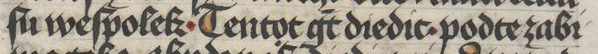ſu weſpolek.Tentot ḡt diedic.podte zabí¬
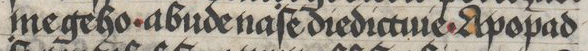me geho.a bude naẛe diedictuíe.Apopad¬
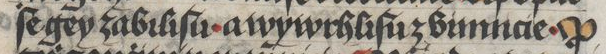ſe gey zabiliſu.a wywrhliſu z vinnicie.Ꝓ¬
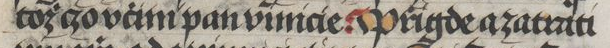toż czo vċini pan vinicie?Pṙigde a zatratí
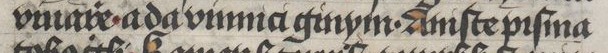vinaṙe.a da vinnici ginym.Ani ſte piſma
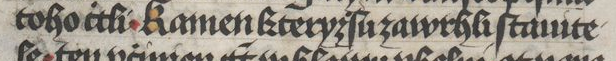toho ċtli.Kameti kterýżſu zavrhli ſtauite
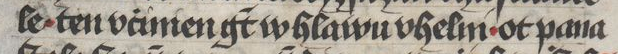le.ten vċinien ḡt to hlawu vhelní.ot pana
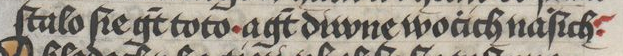ſtalo ſie ḡt toto.a ḡt diwne woċích naẛich?
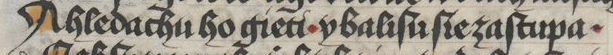A hledachu ho gíeti.ybaliſu ſie zaſtupa.
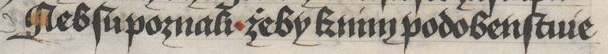Neb ſu poznali.żeby knim podobenſtuíe
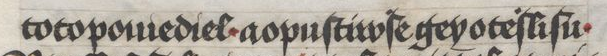toto pouiediel.a opuſtiwẛe gey oteẛli ſu.
